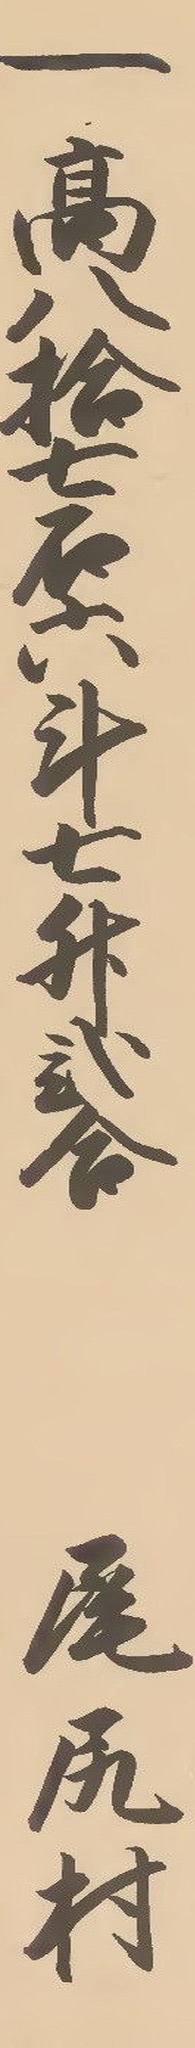一高八拾七石六斗七升弐合尾尻村

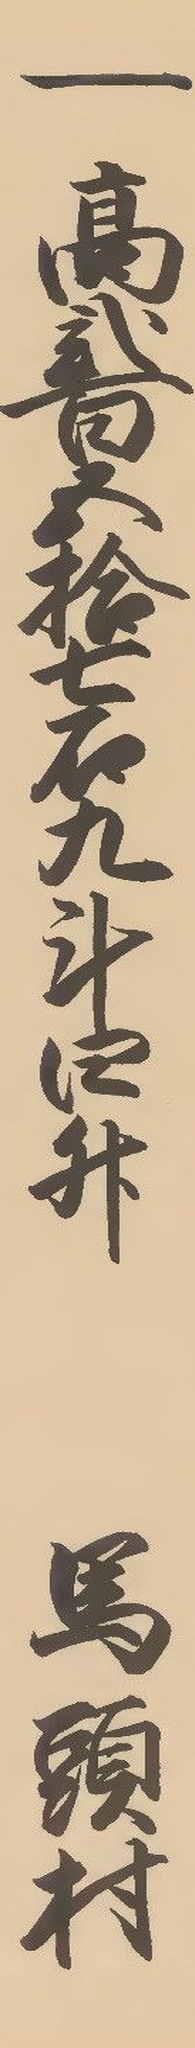一高弐百五拾七石九斗四升馬頭村
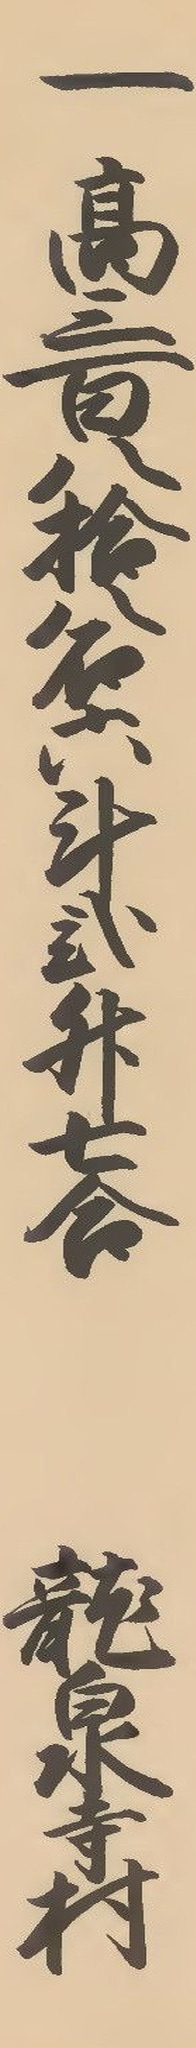一高三百八拾八石六斗弐升七合竜泉寺村
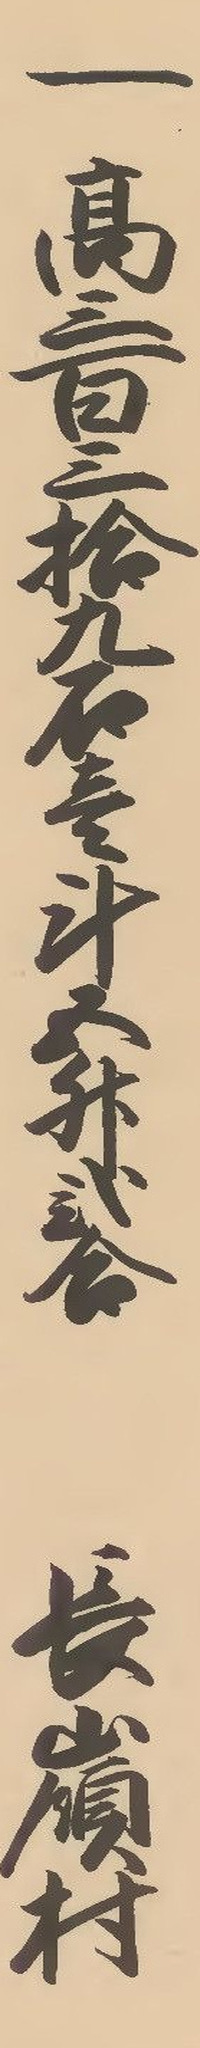一高三百三拾九石壱斗五升弐合長嶺村
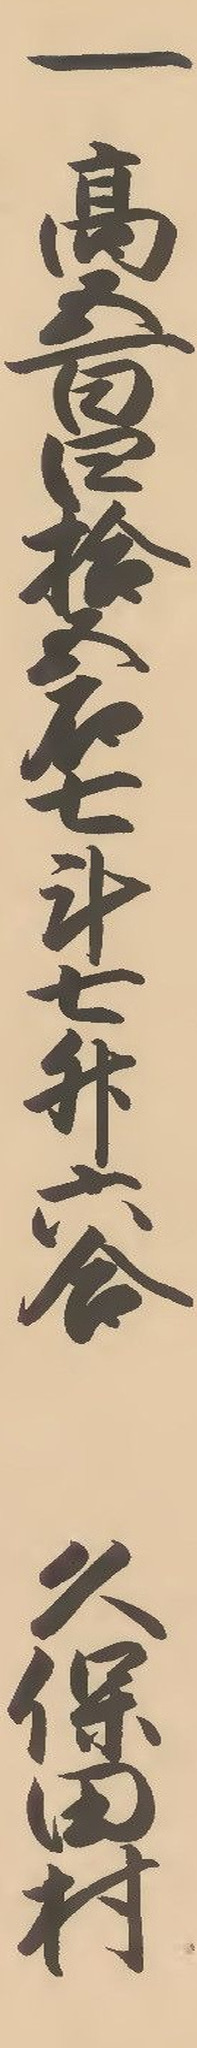一高五百四拾五石七斗七升六合久保田村
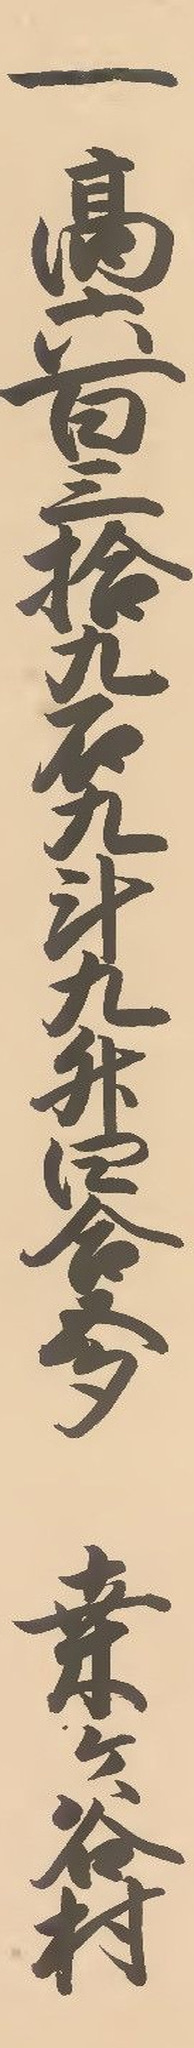一高六百三拾九石九斗九升四合五勺桑ヶ谷村
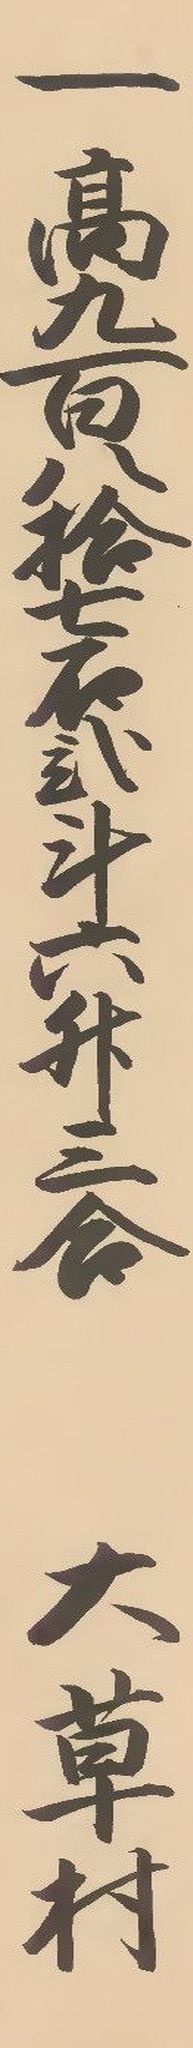一高九百八拾七石弐斗六升三合大草村
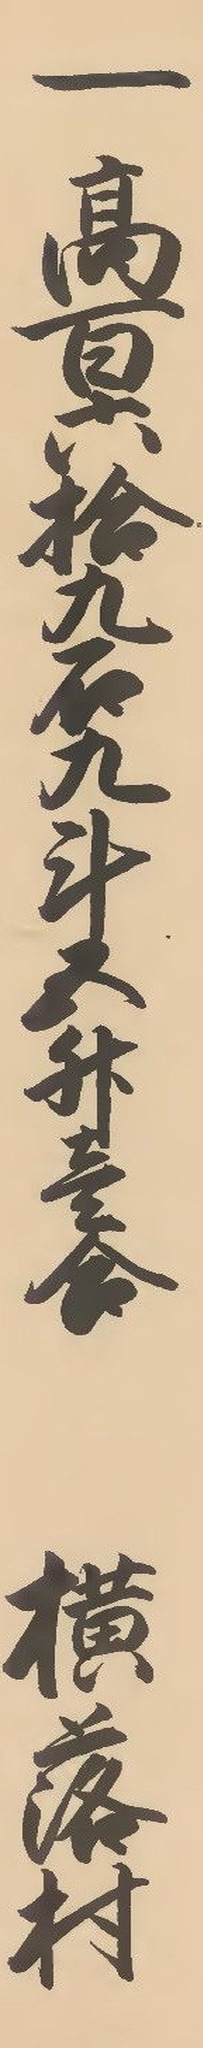一高百六拾九石九斗五升壱合横落村
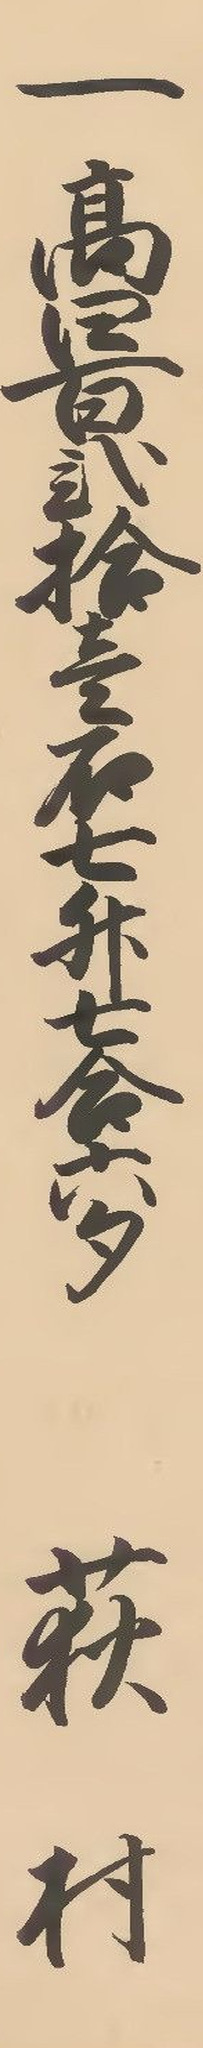一高四百弐拾壱石七升七合六勺荻村

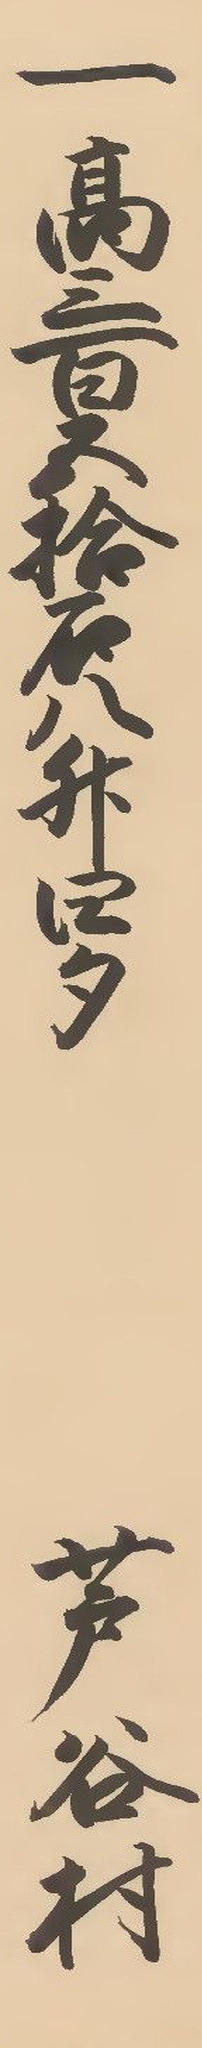一高三百五拾石八升四勺芦谷村
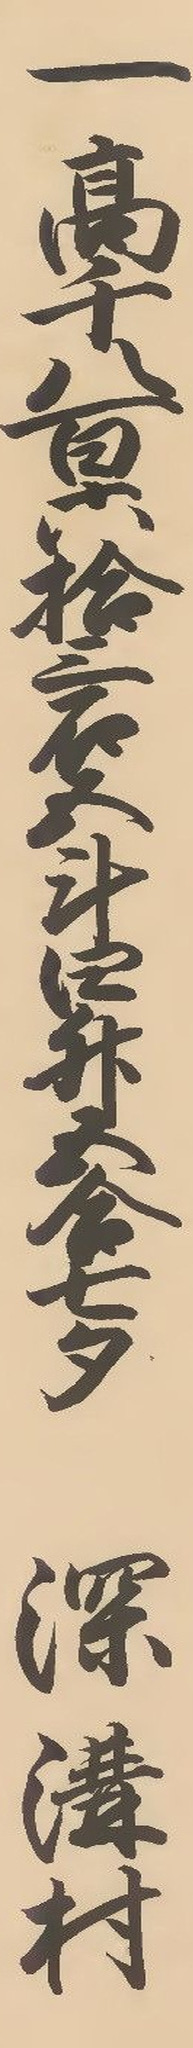一高千八百六拾三石五斗四升五合七勺深溝村
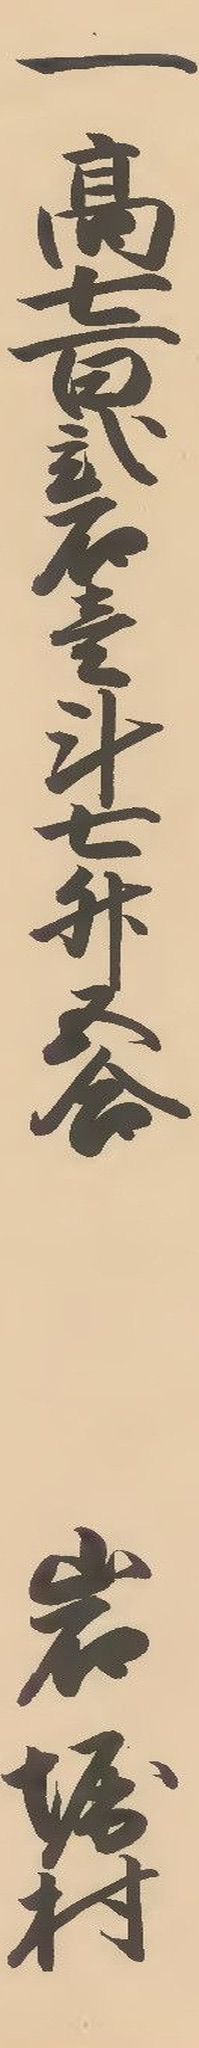一高七百弐石壱斗七升五合岩堀村
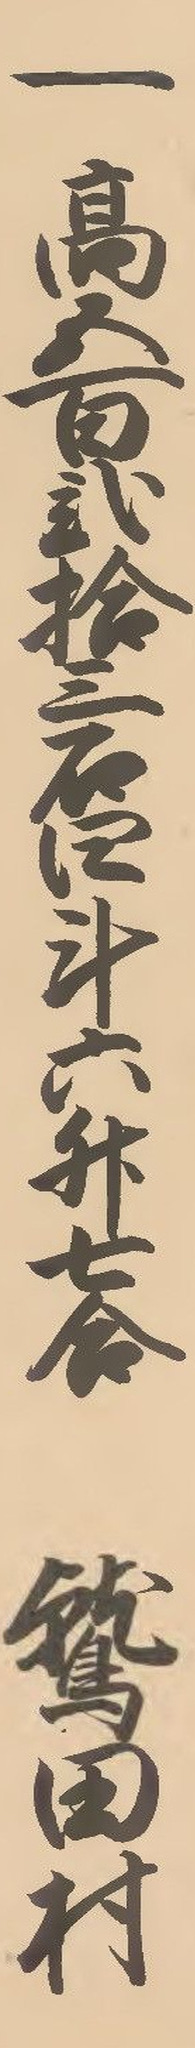一高五百弐拾三石四斗六升七合鷲田村
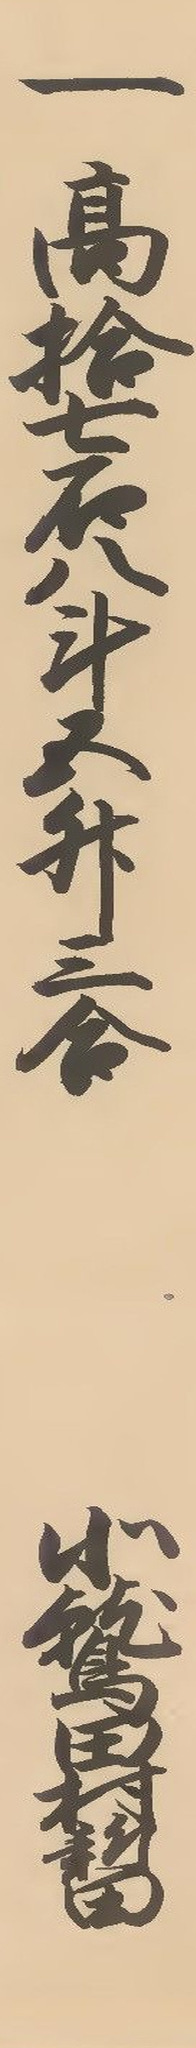一高拾七石八斗五升三合北鷲田村新田
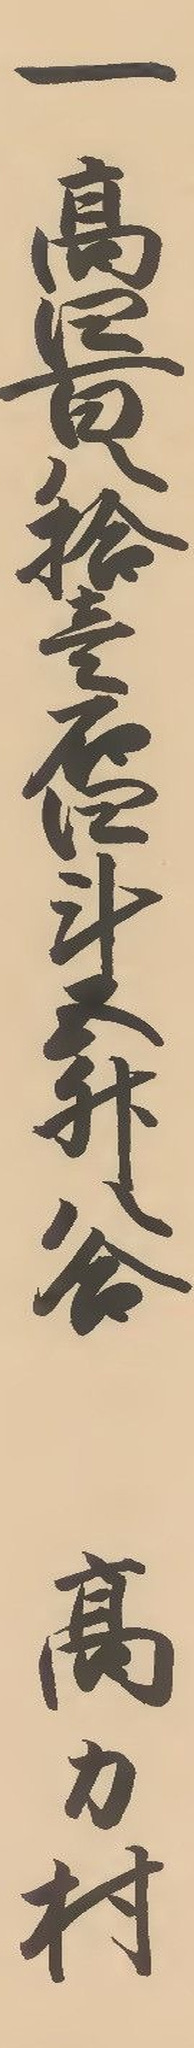一高四百八拾壱石四斗五升八合高力村
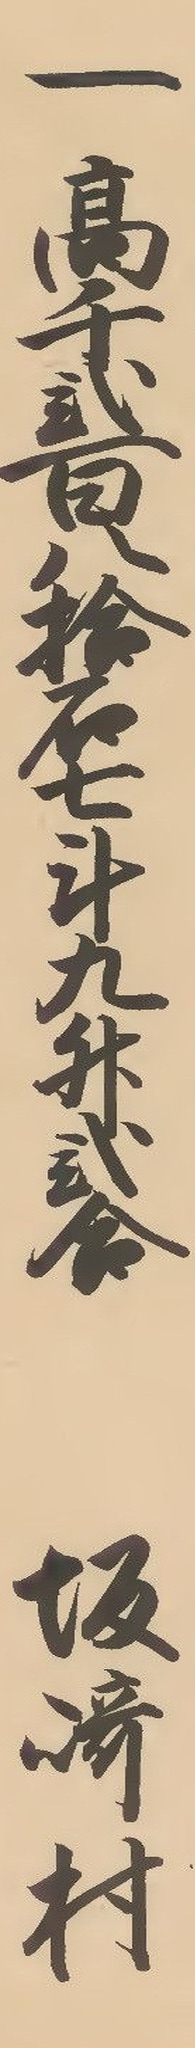一高千弐百八拾石七斗九升弐合坂崎村
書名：三河国郷帳
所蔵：国立公文書館 National Archives of Japan
